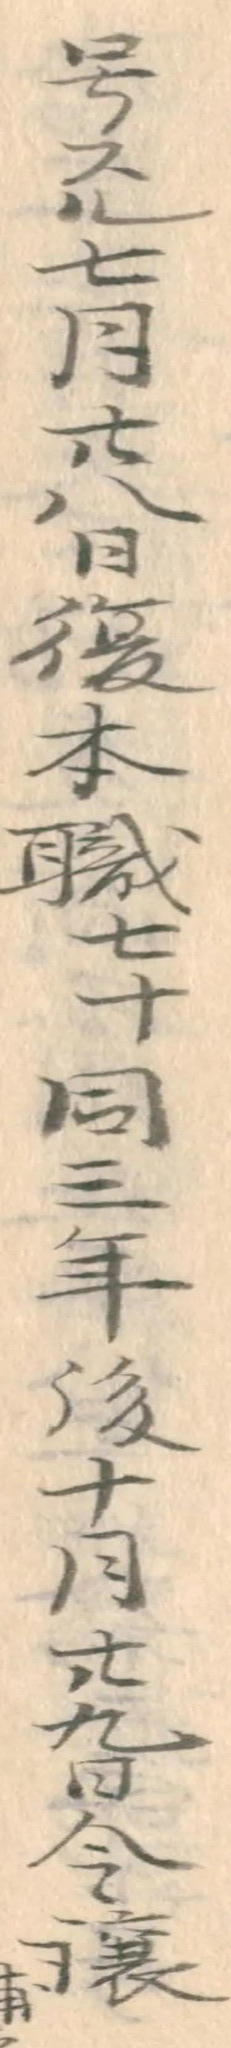号スル七月廿八日復本職七十同三年後十月廿九日令譲
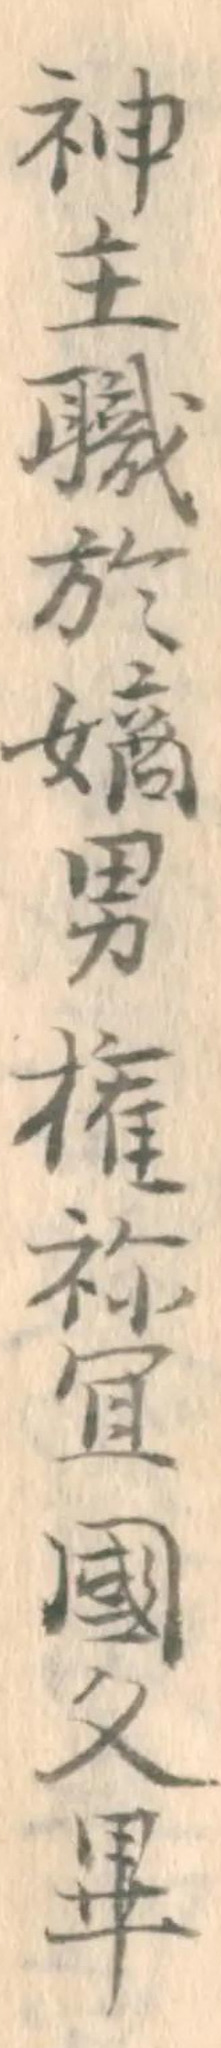神主職於嫡男権祢宜国久畢
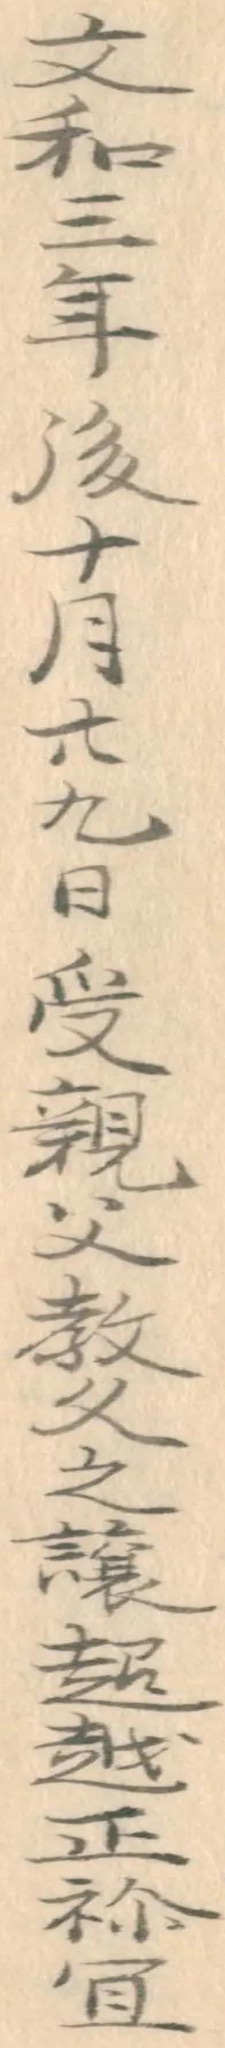文和三年後十月廿九日受親父教久之譲超越正祢宜
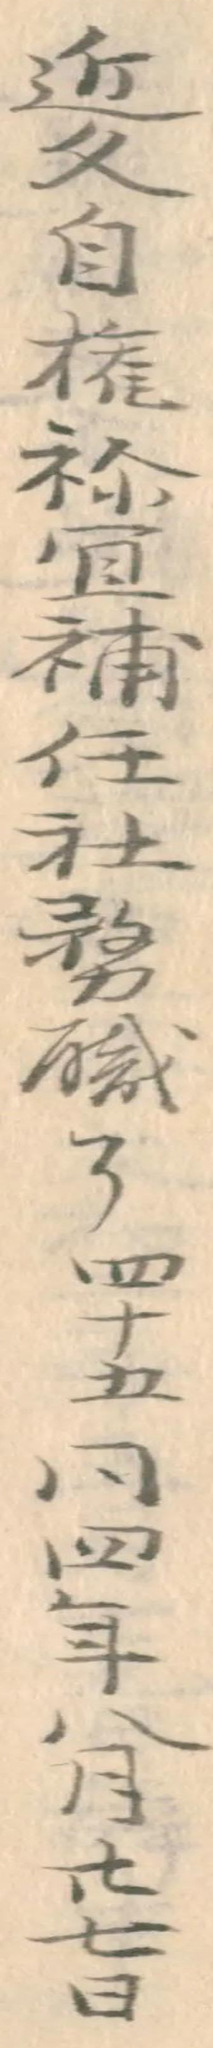近久自権祢宜補任社務職了四十五同四年八月廿七日
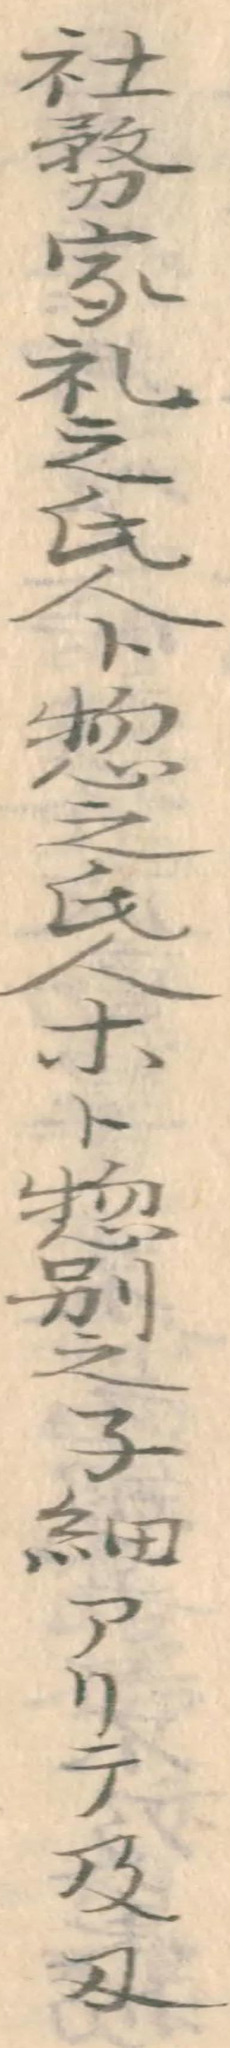社務家礼之氏人ト惣之氏人等ト惣別之子細アリテ及刃
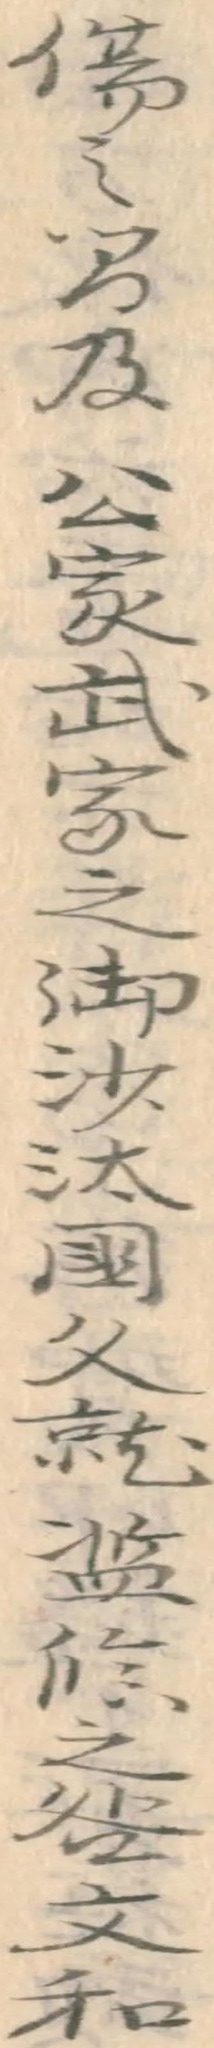傷之間及公家武家之御沙汰国久就濫臨之咎文和
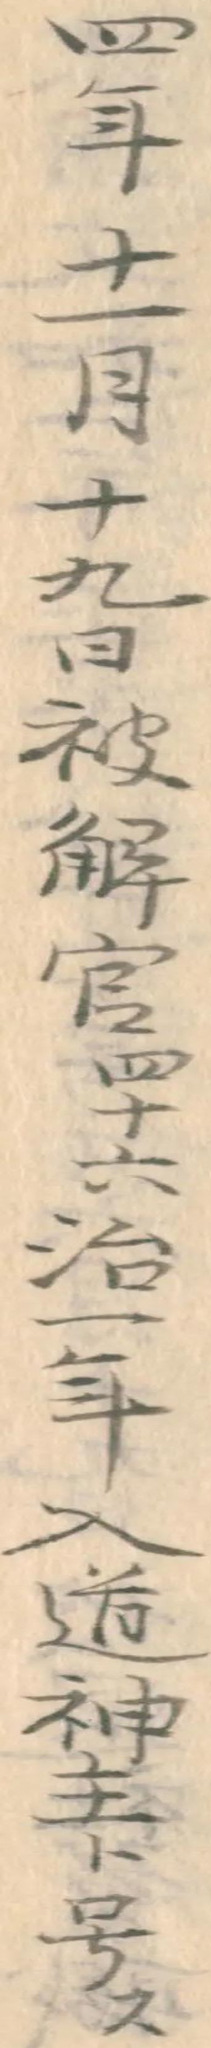四年十一月十九日被解官四十六治一年入道神主ト号ス
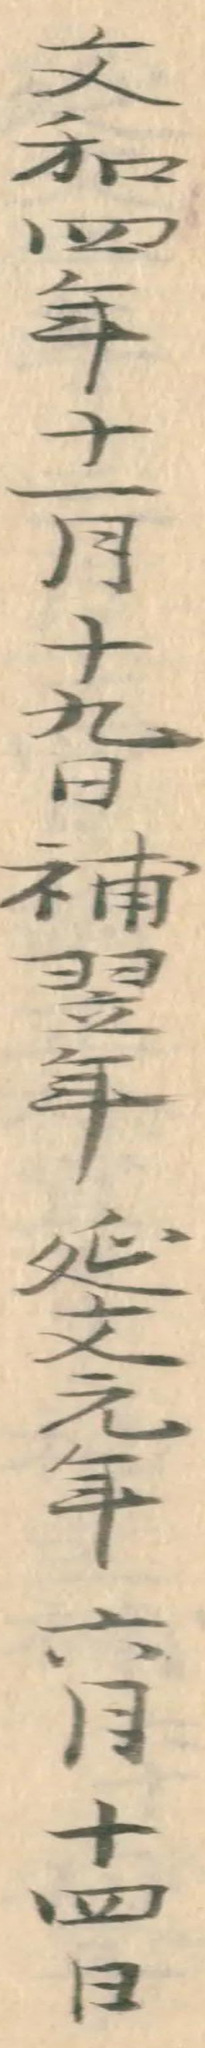文和四年十一月十九日補翌年延文元年六月十四日
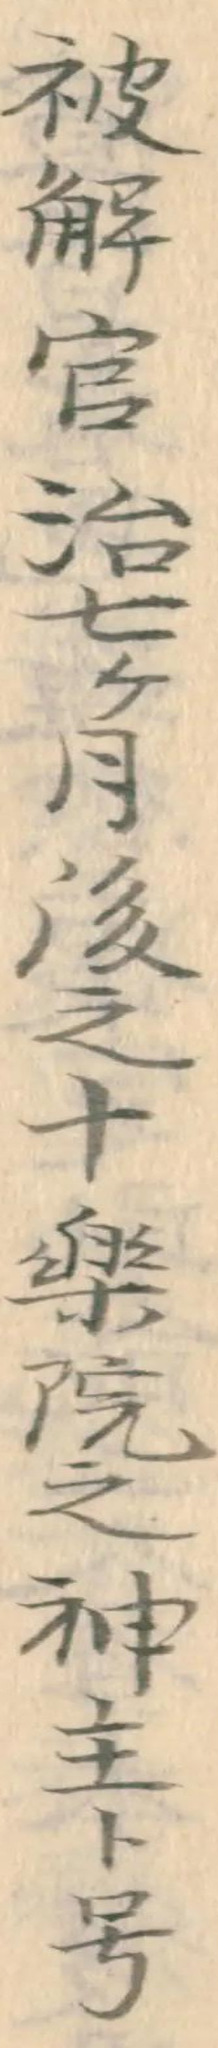被解官治七ケ月後之十楽院之神主ト号
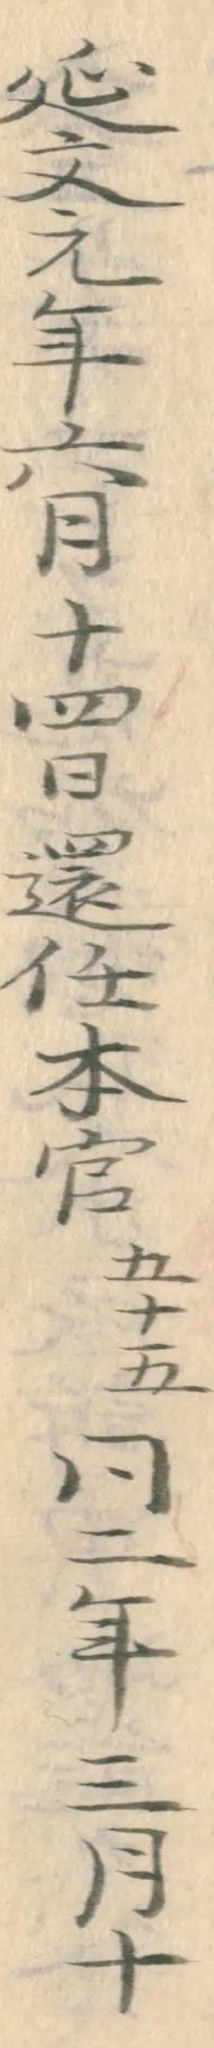延文元年六月十四日還任本官五十五同二年三月十
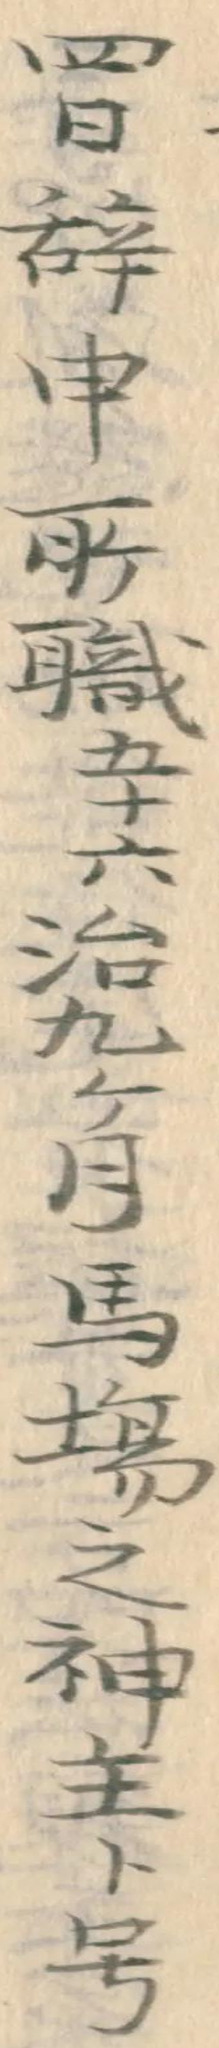四日辞申所職五十六治九ケ月馬場之神主ト号
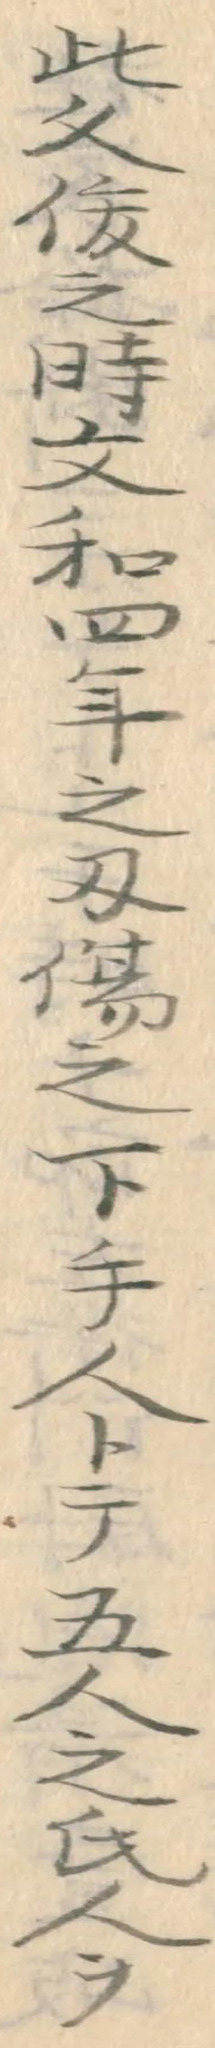此久俊之時文和四年之刃傷之下手人トテ五人之氏人ヲ
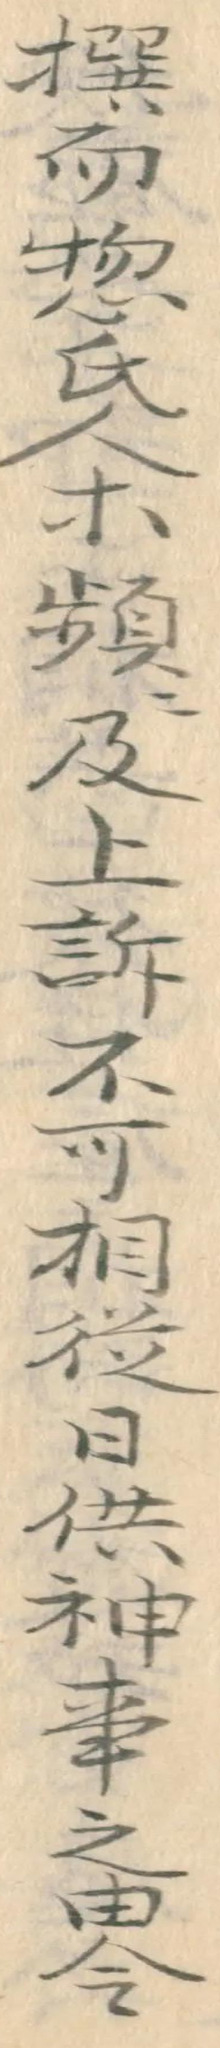撰而惣氏人等頻ニ及上訴不可相従日供神事之由令
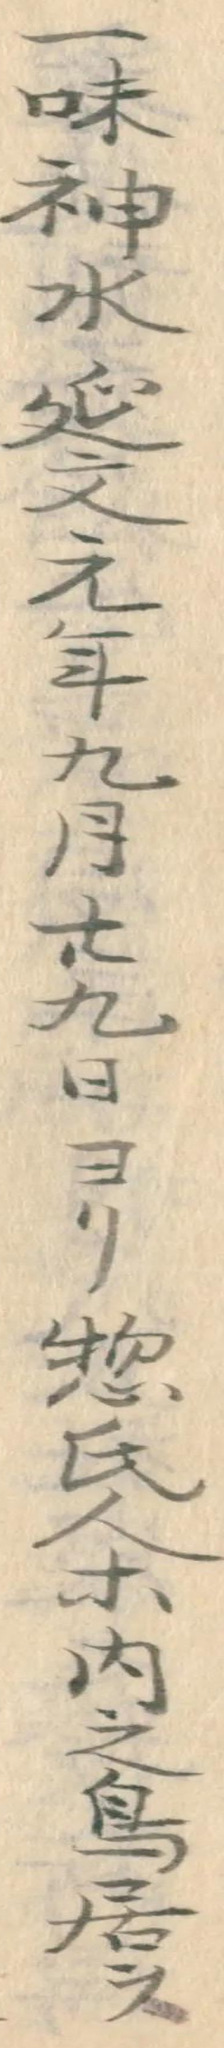一味神水延文元年九月廿九日ヨリ惣氏人等内之鳥居ヲ
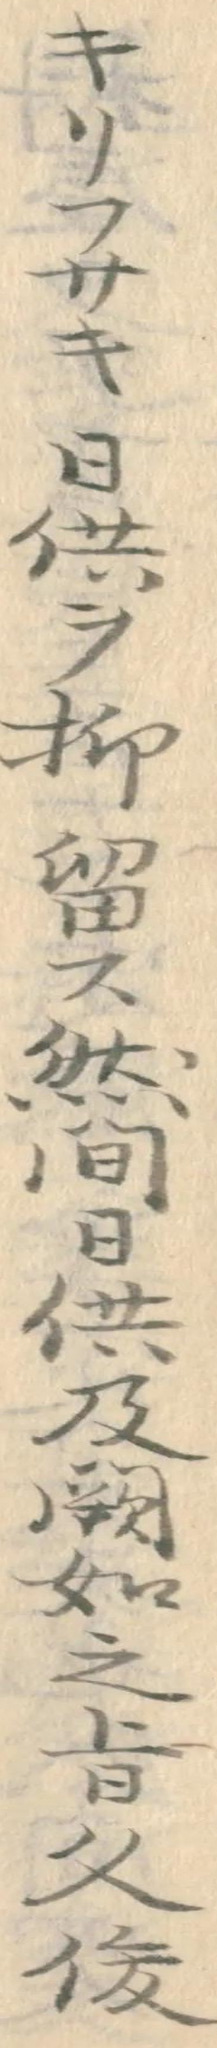キリフサキ日供ヲ抑留ス然間日供及闕如之旨久俊
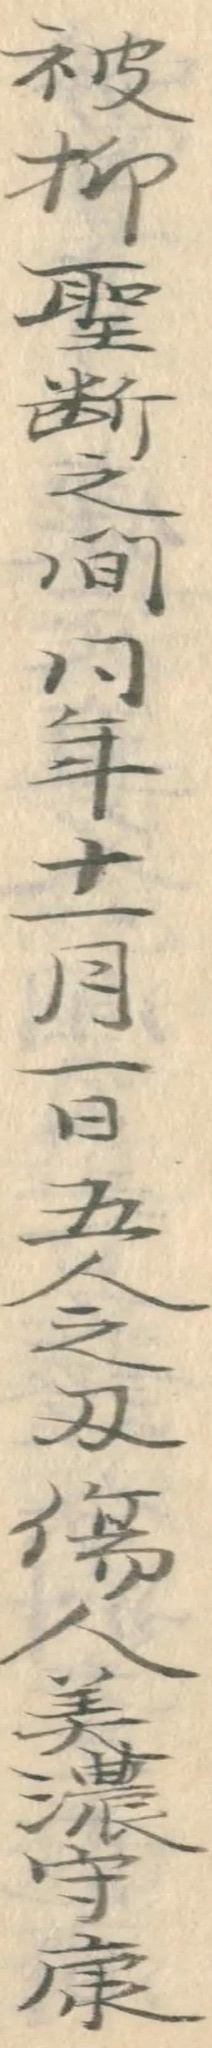被抑聖断之間同年十一月一日五人之刃傷人美濃守康
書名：賀茂社記録. 第24冊
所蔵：国立国会図書館 National Diet Library, JAPAN
